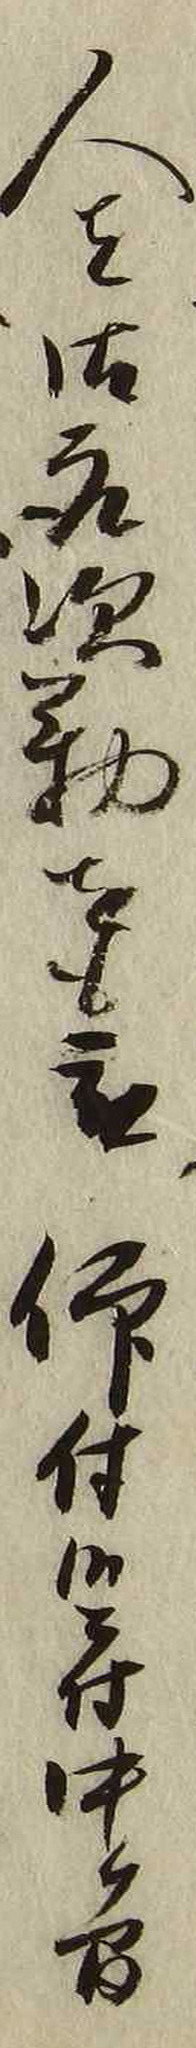人者御取次勤をも被仰付候ニ付中ケ間
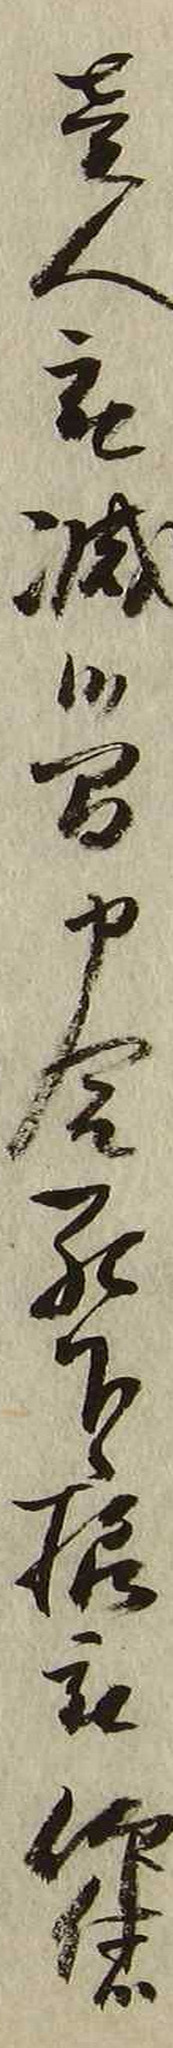壱人被減候間申合罷下候様被仰付候
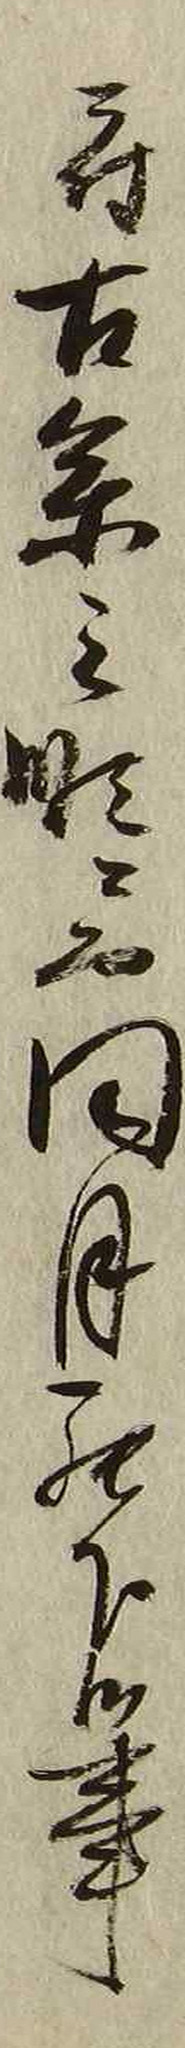ニ付古参之順ニ而同月罷下候事
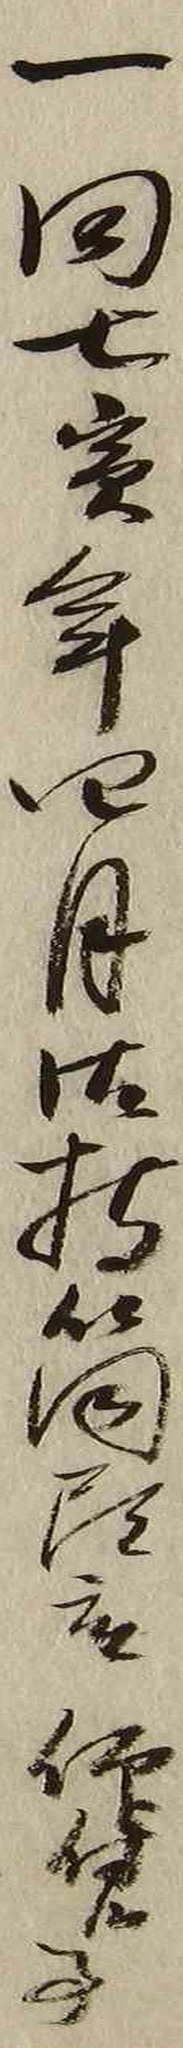一同七寅年四月御持筒頭被仰付候事
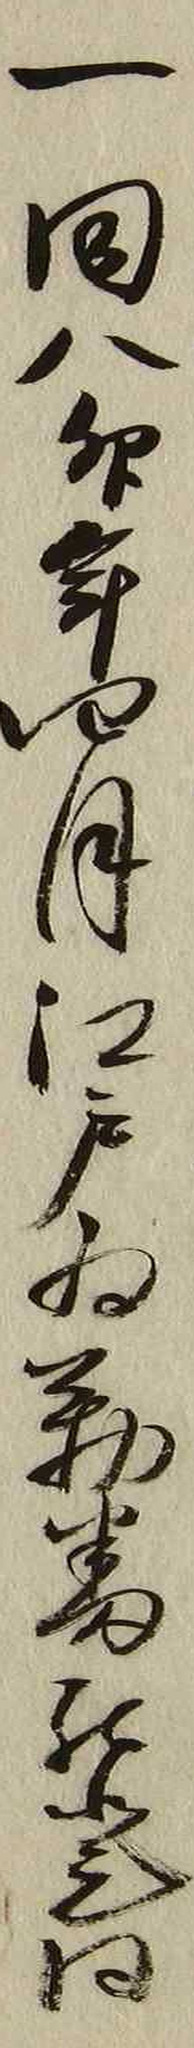一同八卯年四月江戸為勤番罷登同
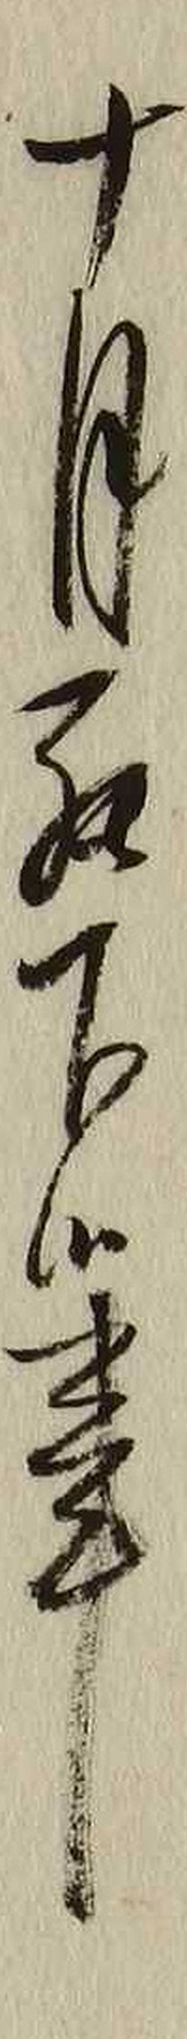十月罷下候事
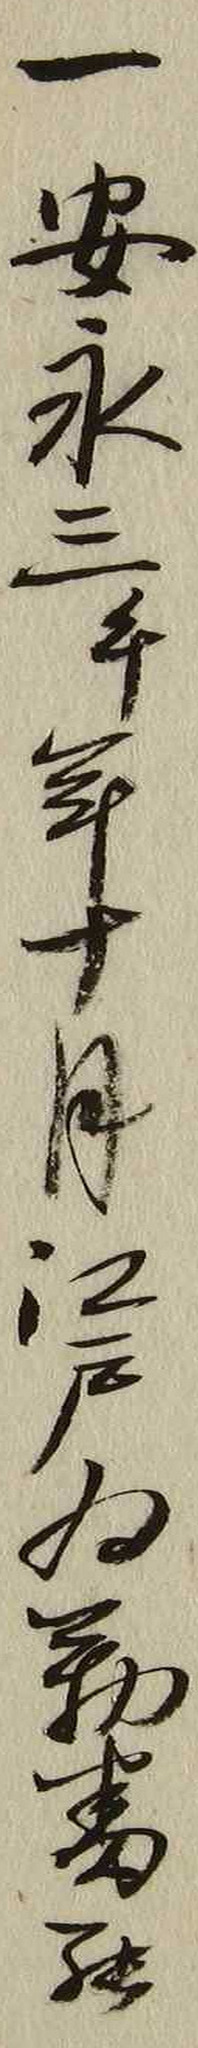一安永三午年十月江戸為勤番罷
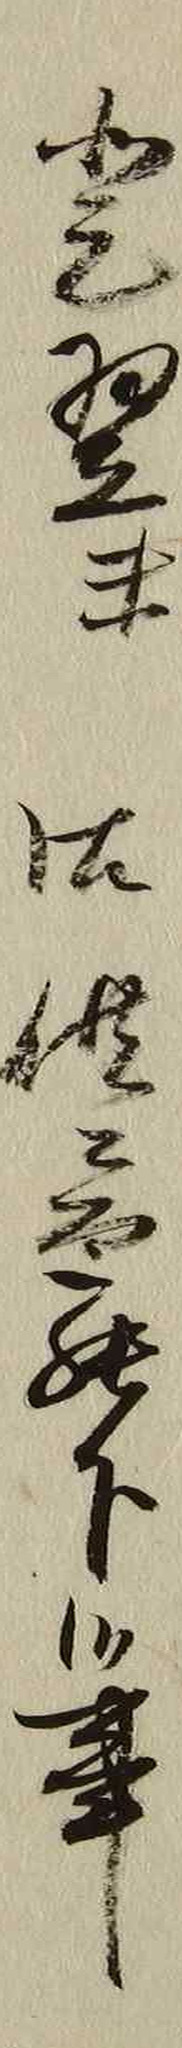登翌未御供ニ而罷下候事
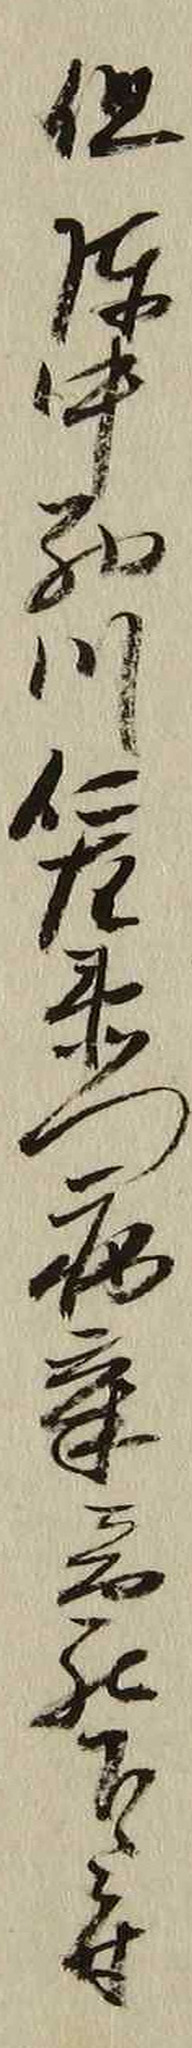但陣中西川仁左衛門病気ニ而罷下候ニ付
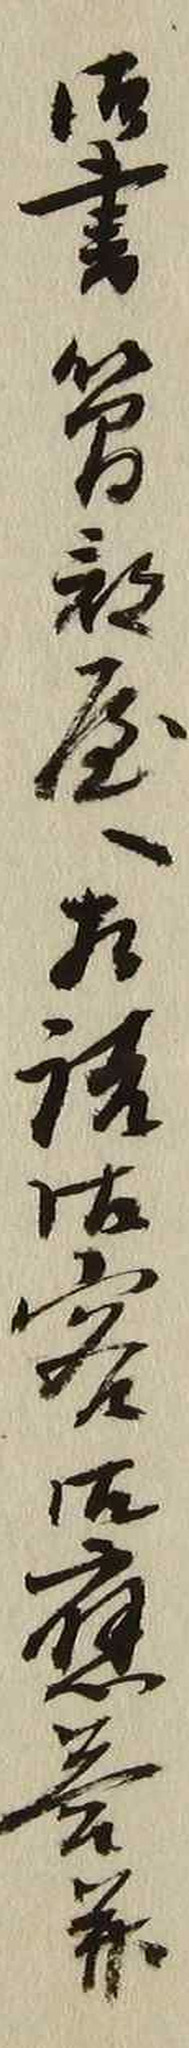御書簡部屋へ相詰御客御応答并
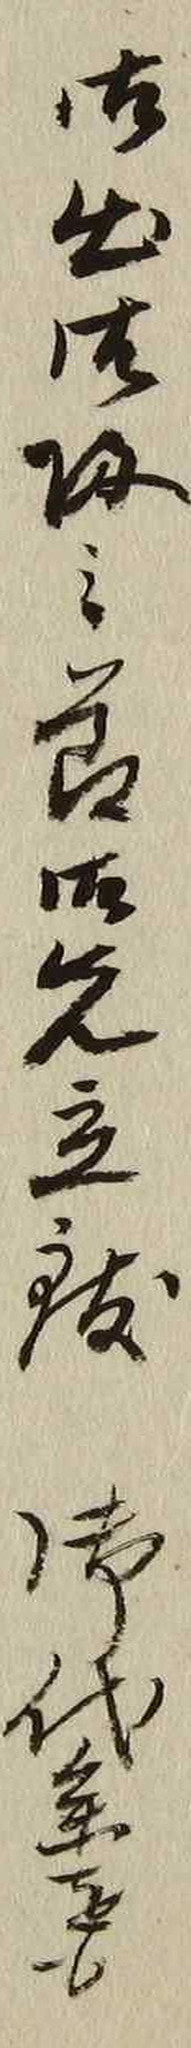御出御帰之節御先立致御代参をも
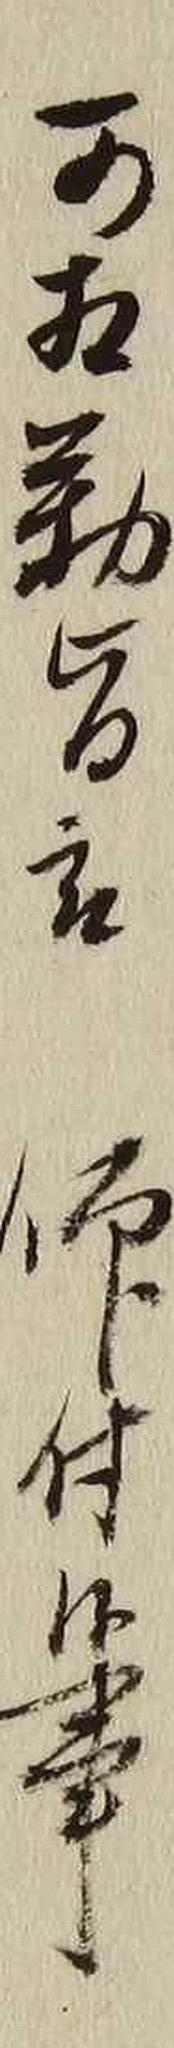可相勤旨被仰付候事
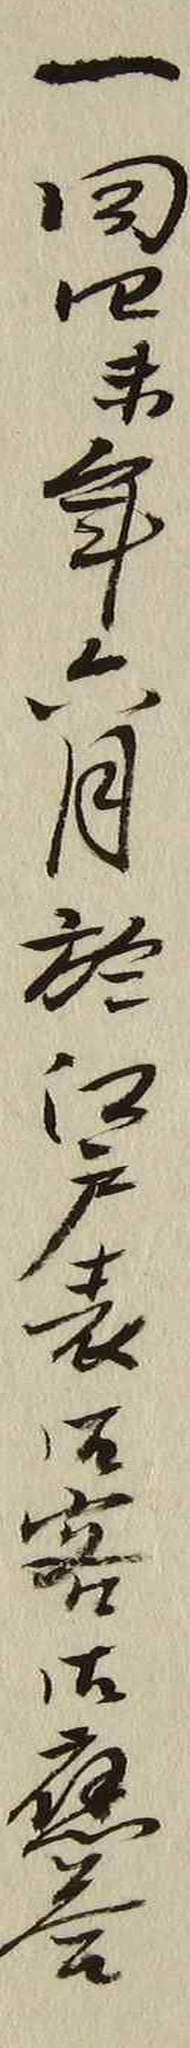一同四未年六月於江戸表御客御応答
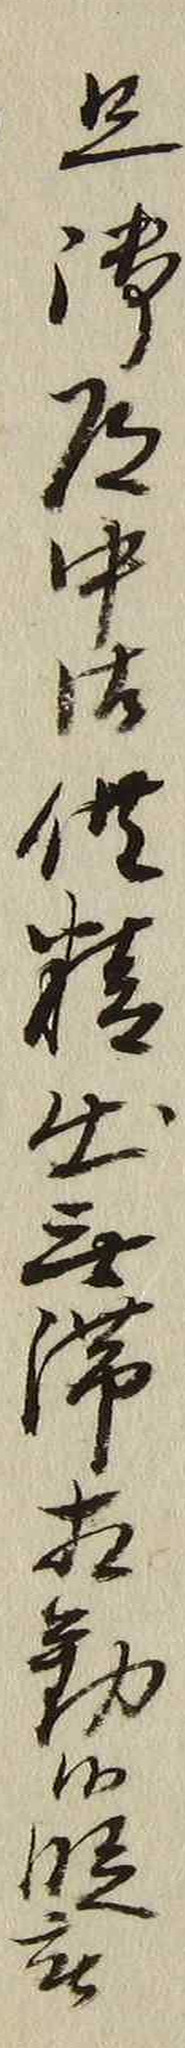且御道中御供精出無滞相勤候段被
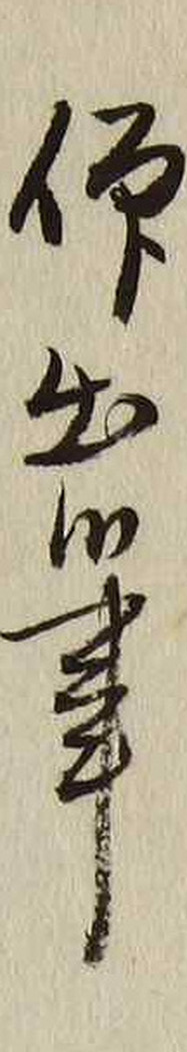仰出候事
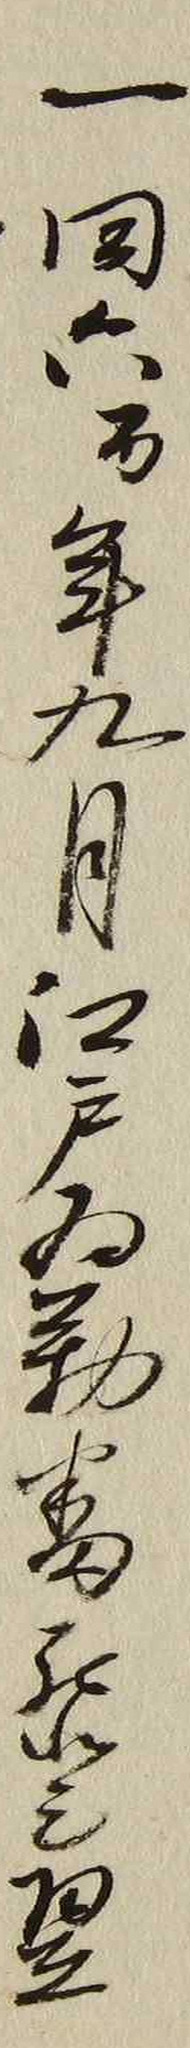一同六酉年九月江戸為勤番罷登翌
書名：諸士系譜　巻之356　す之部6
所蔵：会津若松市立会津図書館
